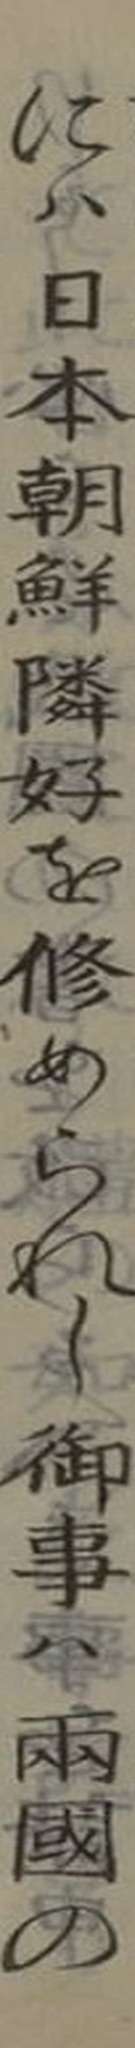には日本朝鮮隣好を修められし御事は兩國の
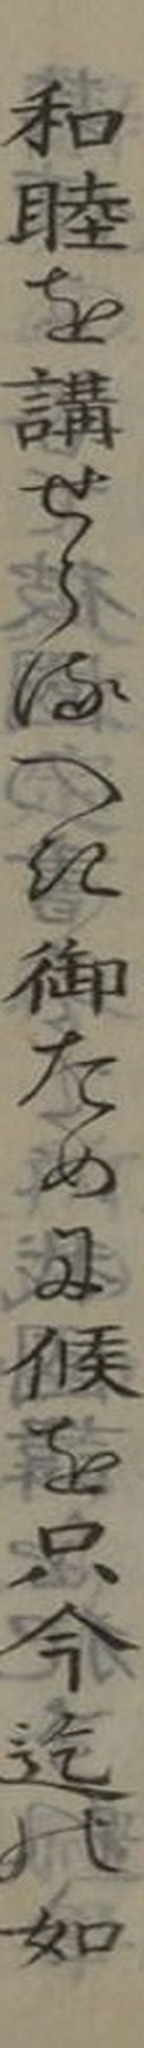和睦を講せらるへき御ために候を只今迄の如
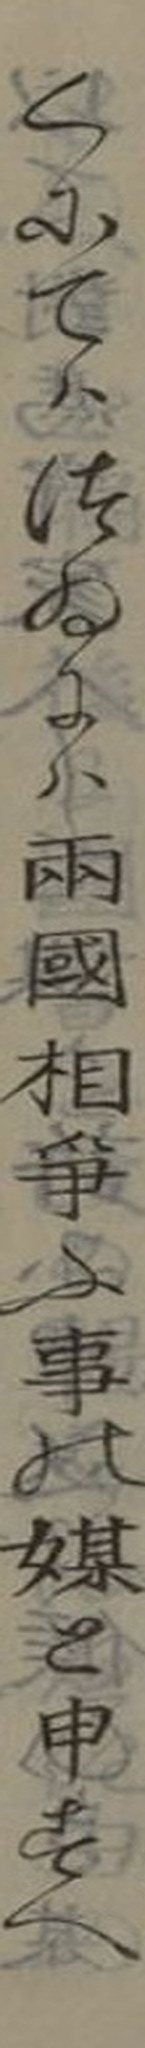くにてはつゐには兩國相爭ふ事の媒と申すへ
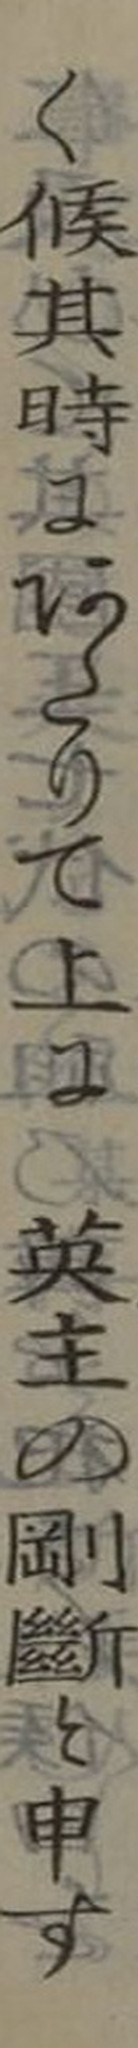く候其時にあたりて上に英王の剛斷と申す
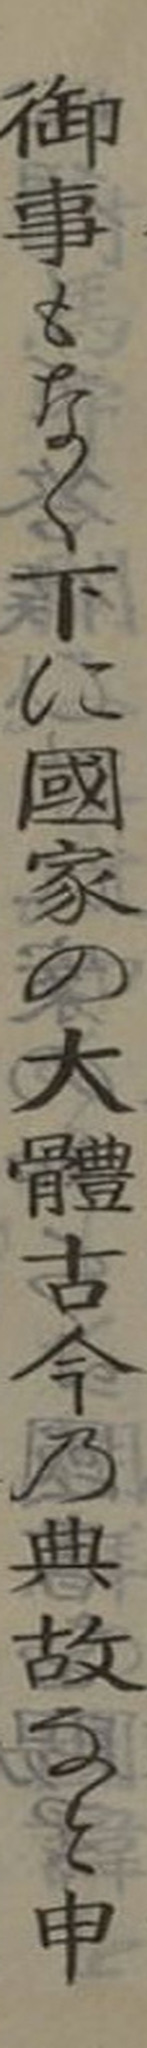御事もなく下に國家の大體古今の典故なと申
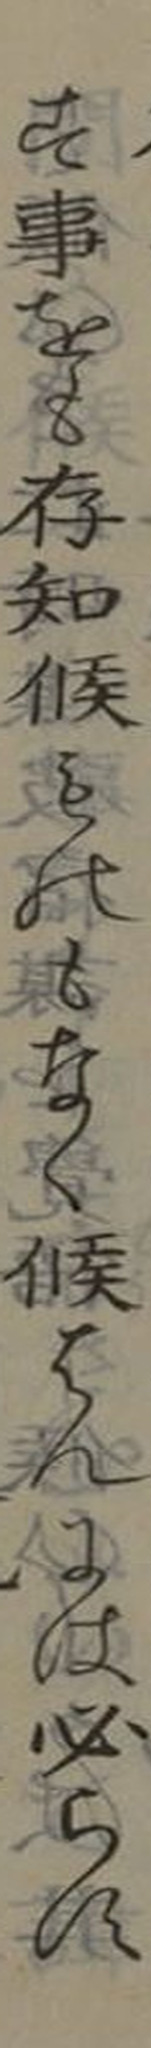す事をも存知候ものもなく候はんには必らす
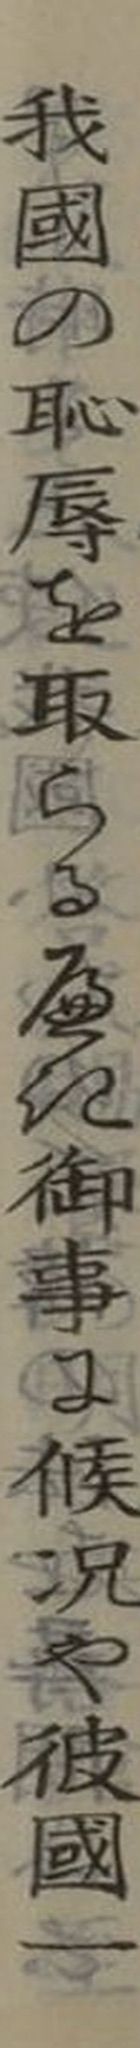我國の恥辱を取らるへき御事に候況や彼國一
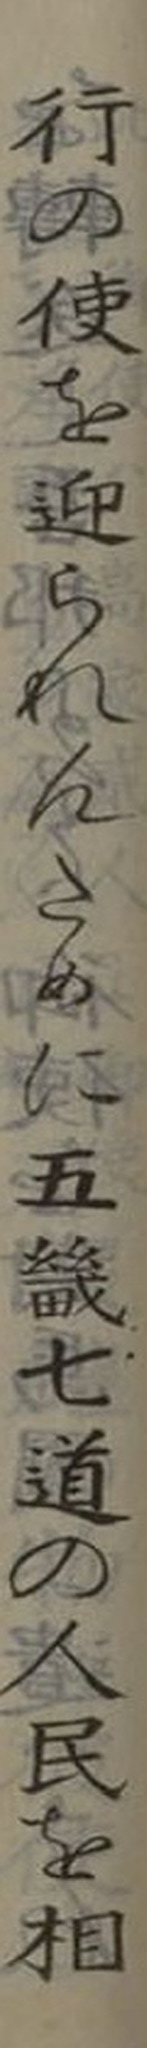行の使を迎られんために五畿七道の人民を相
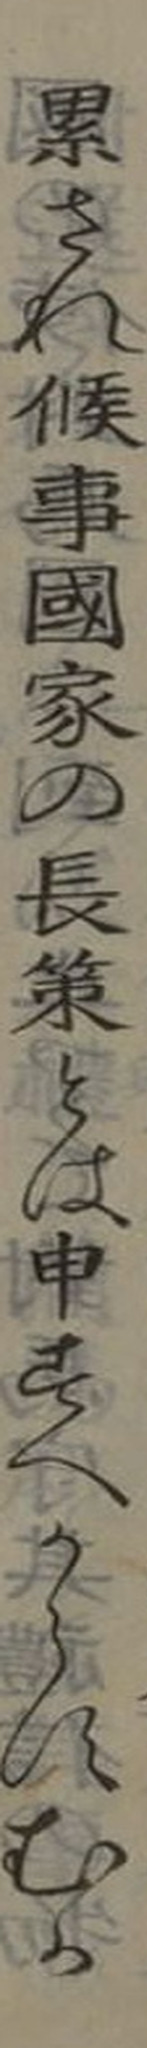累され候事國家の長策とは申すへからすむか
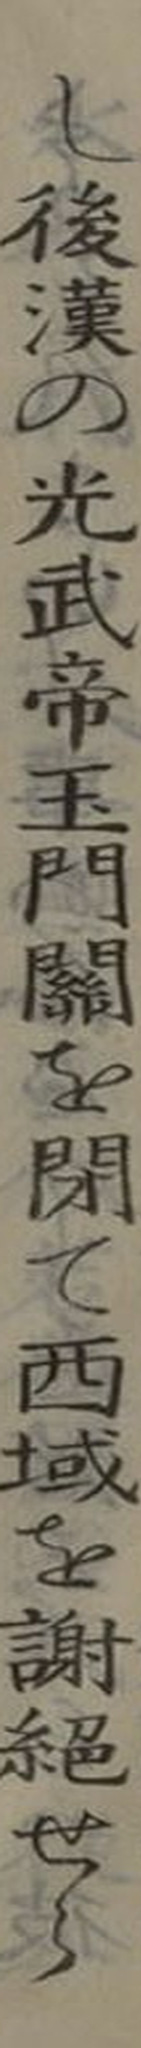し後漢の光武帝玉門關を閉て西域を謝絶せら
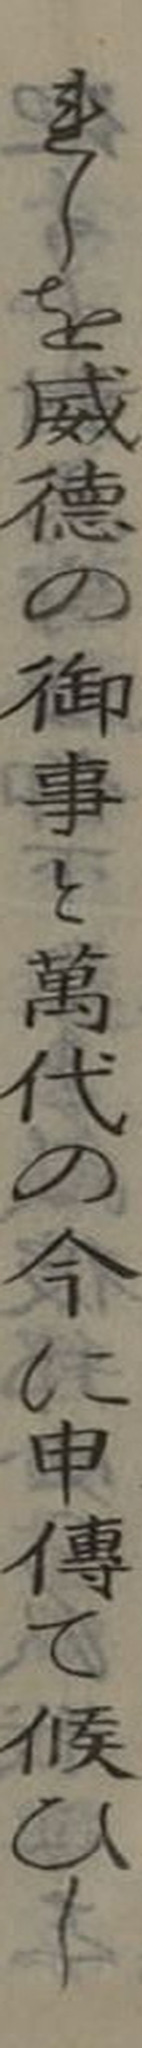れしを威徳の御事と萬代の今に申傳て候ひし
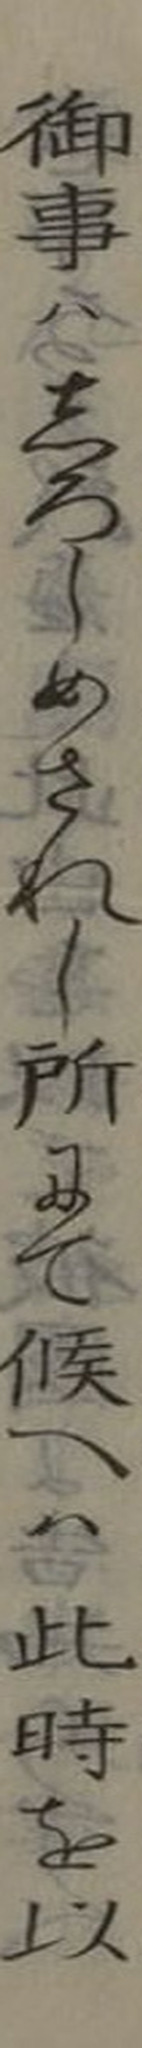御事はしろしめされし所にて候へは此時を以
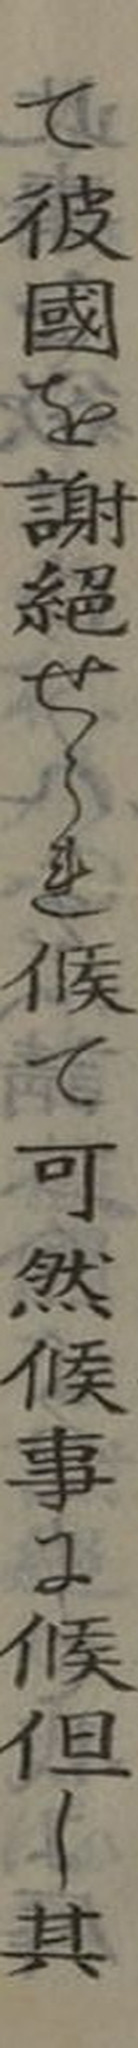て彼國を謝絶せられ候て可然候事に候但し其
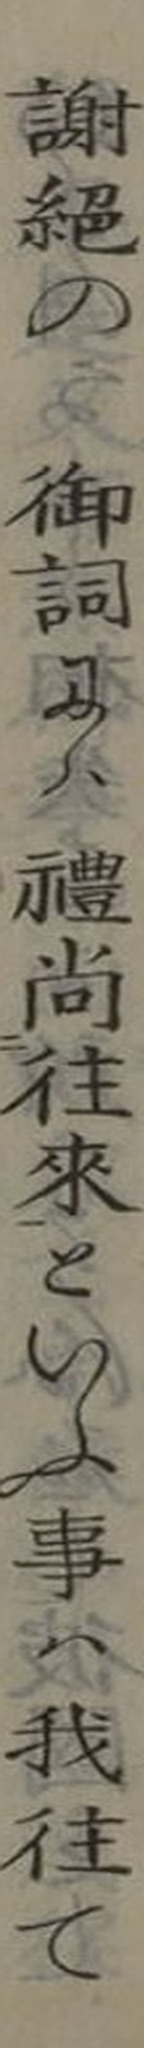謝絶の御詞には禮尚往来といふ事は我往て
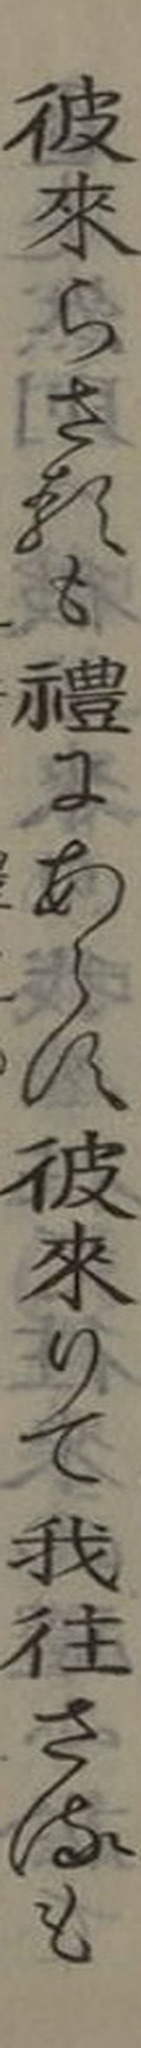彼來らさるも禮にあらす彼來りて我往さるも
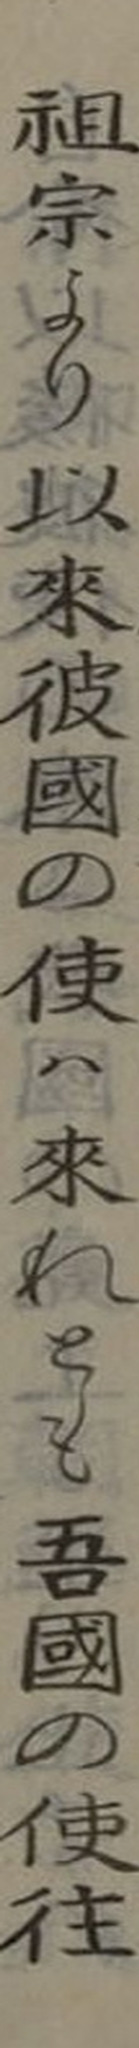祖宗より以來彼國の使は來れとも吾國の使往
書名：骨董録
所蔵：University of the Ryukyus Library
